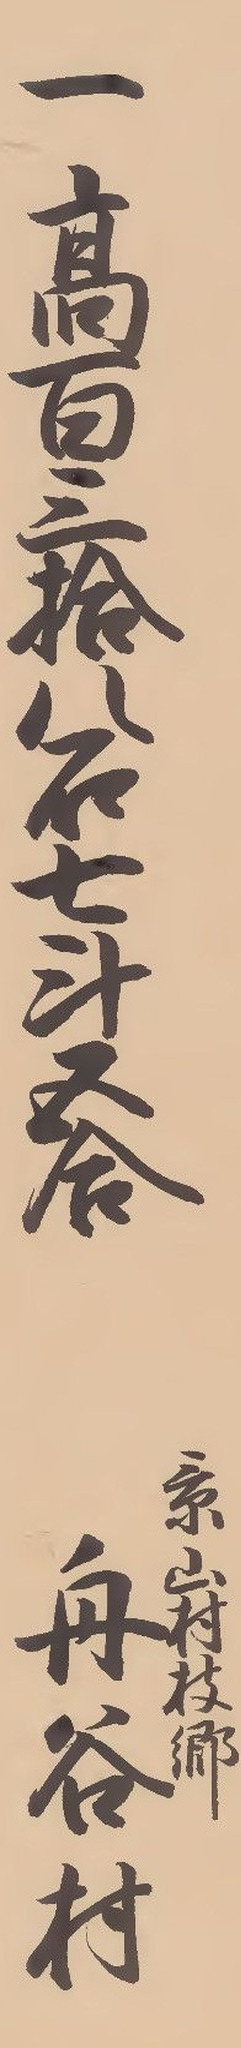一髙百三拾八石七斗五合舟谷村
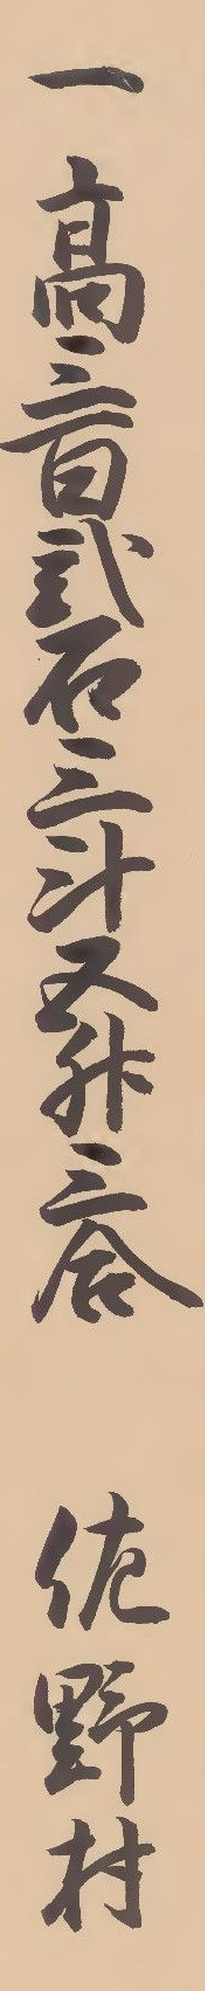一髙三百弐石三斗五升三合佐野村

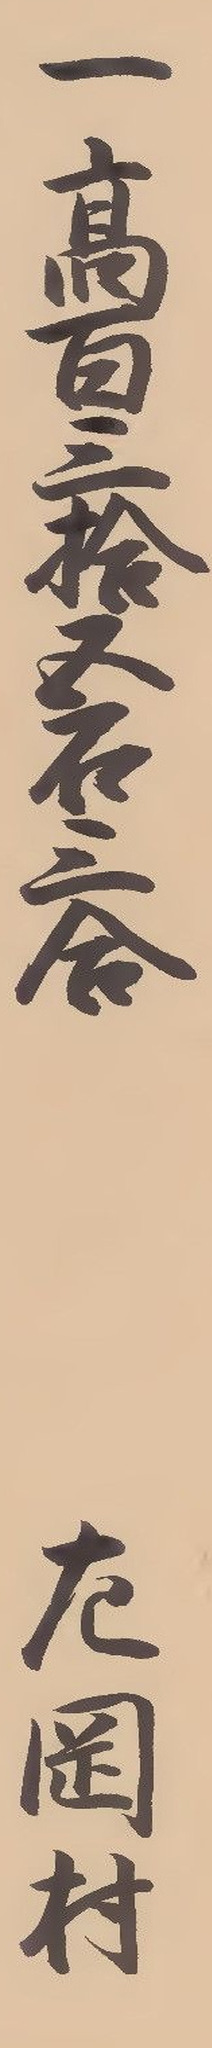一髙百三拾五石三合左岡村
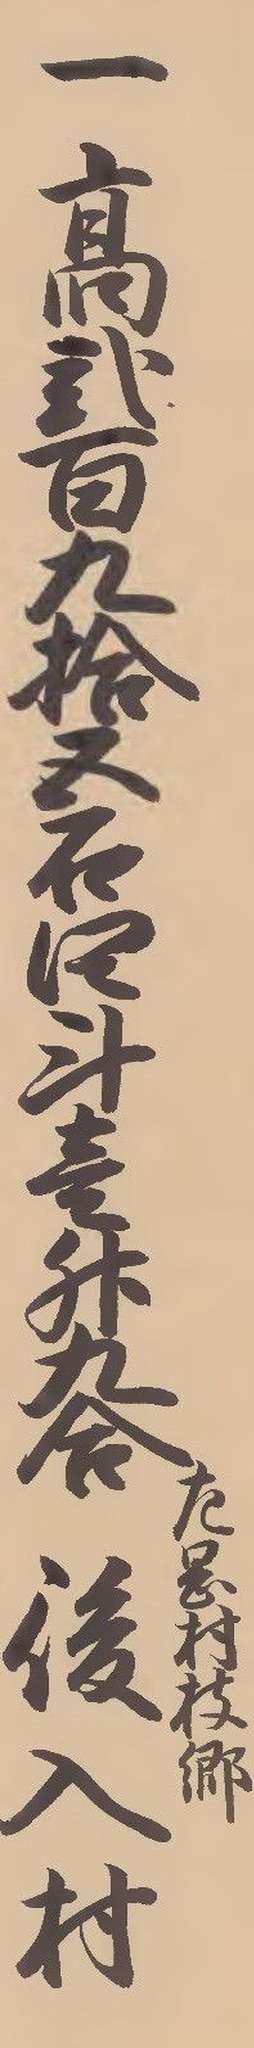一髙弐百九拾五石四斗壱升九合後入村
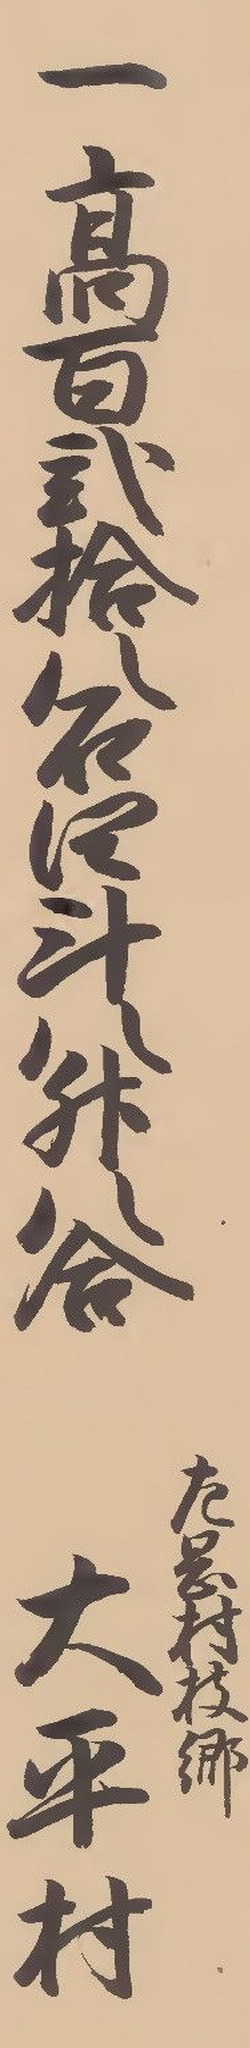一髙百弐拾八石四斗八升八合大平村
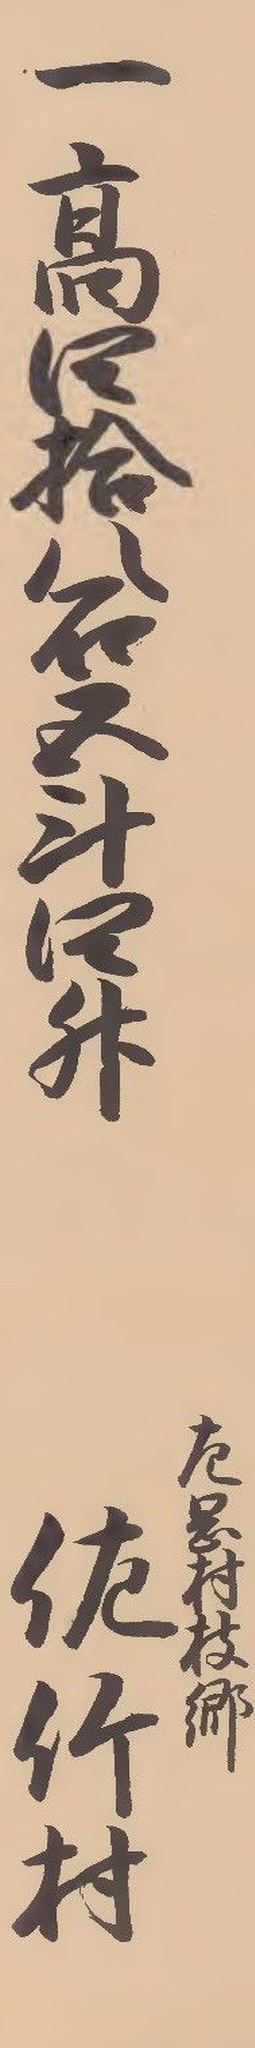一髙四拾八石五斗四升佐竹村
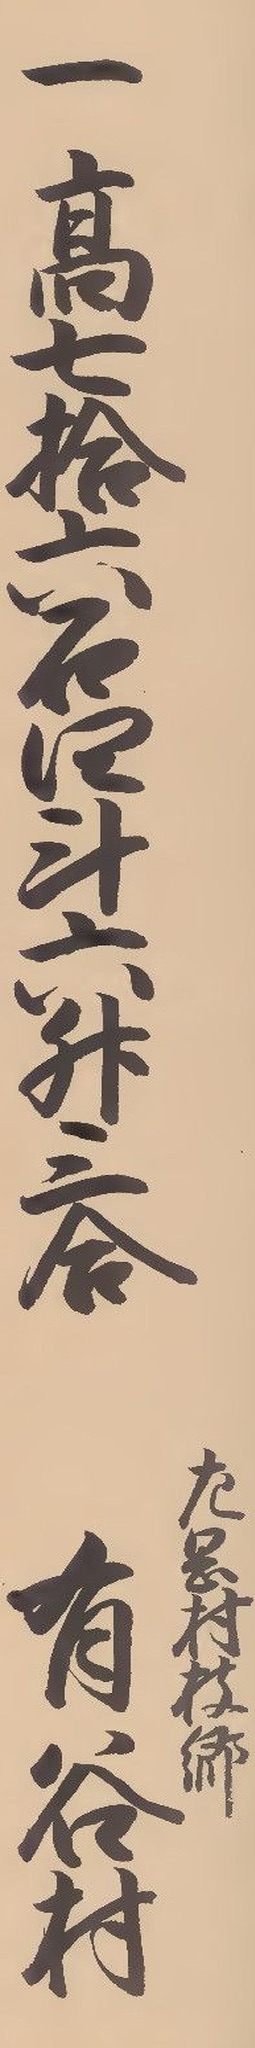一髙七拾六石四斗六升三合有谷村
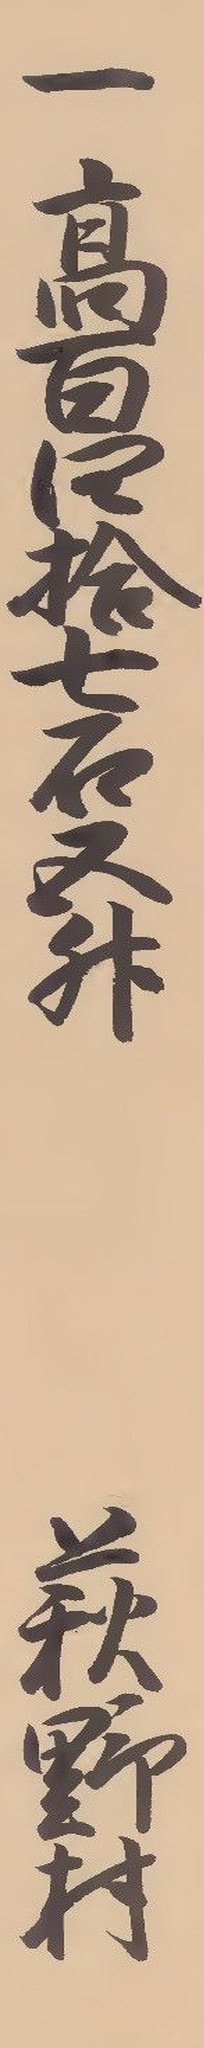一髙百四拾七石五升萩野村
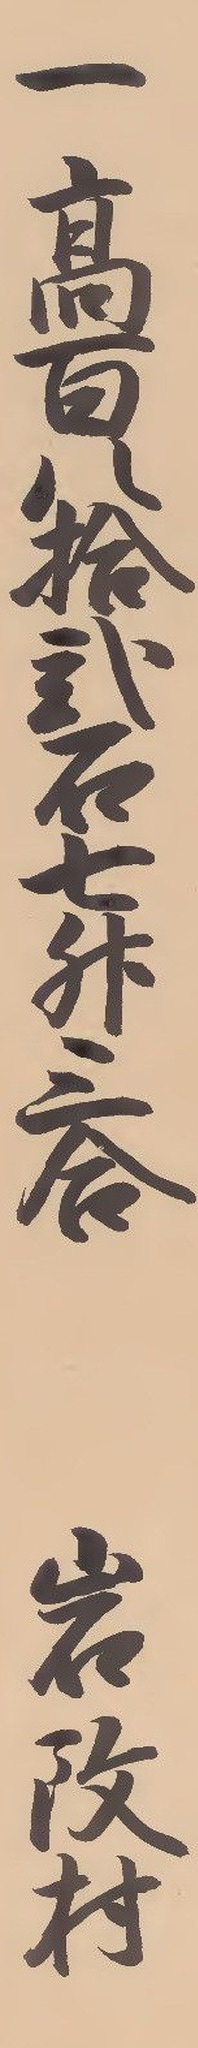一髙百八拾弐石七升三合岩改村
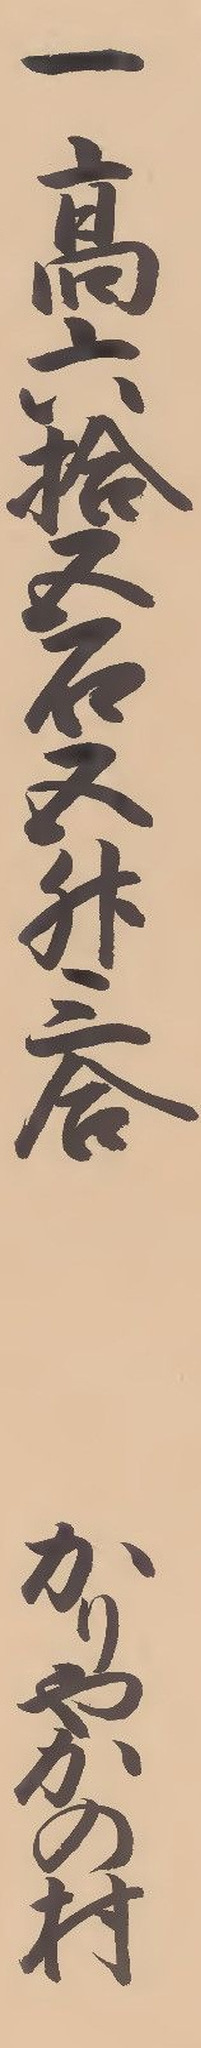一髙六拾五石五升三合かりやかの村

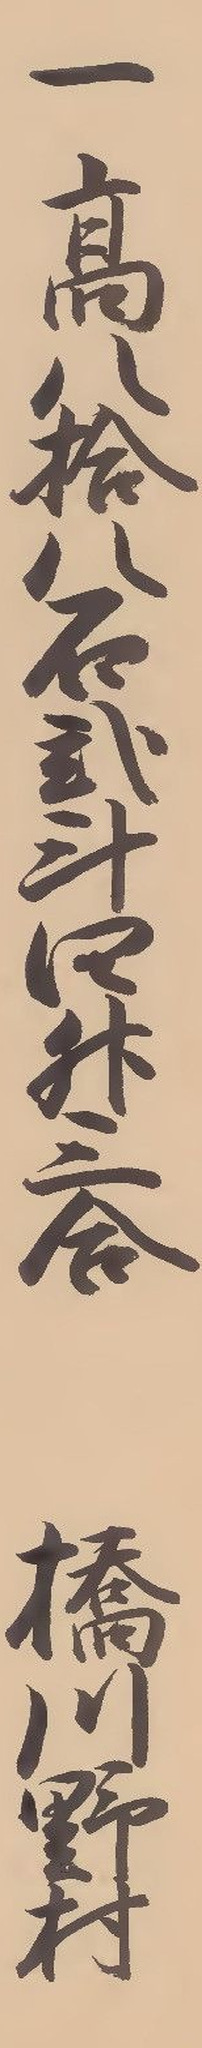一髙八拾八石弐斗四升三合橋川野村
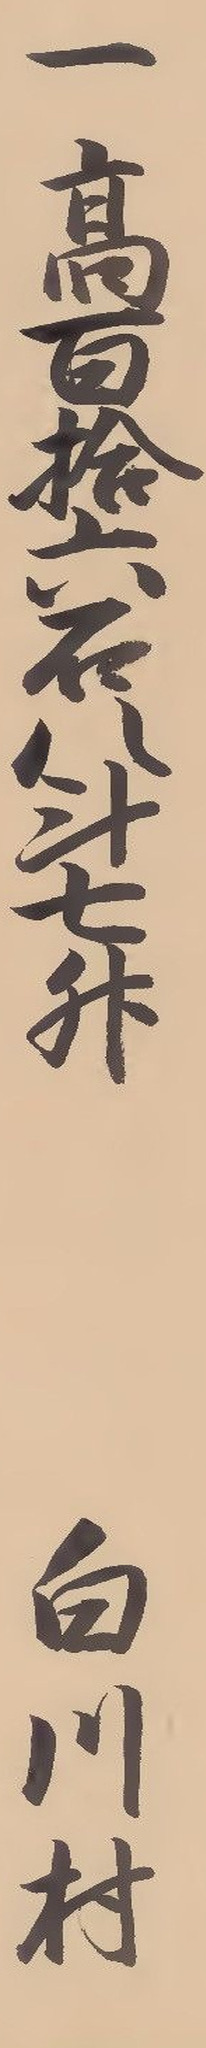一髙百拾六石八斗七升白川村
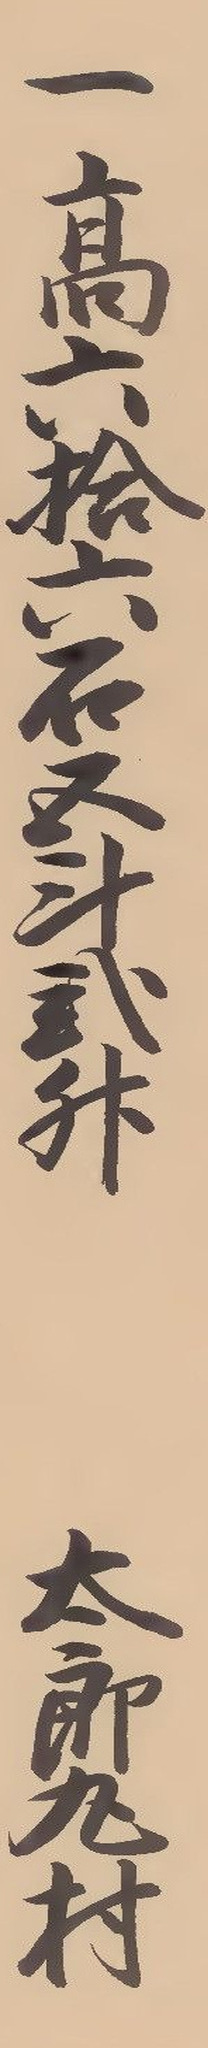一髙六拾六石五斗弐升太郎丸村
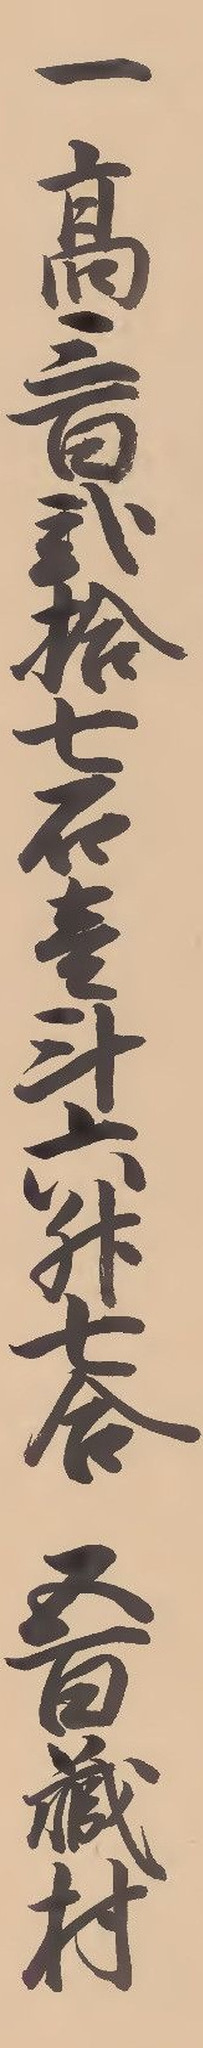一髙三百弐拾七石壱斗六升七合五百藏村
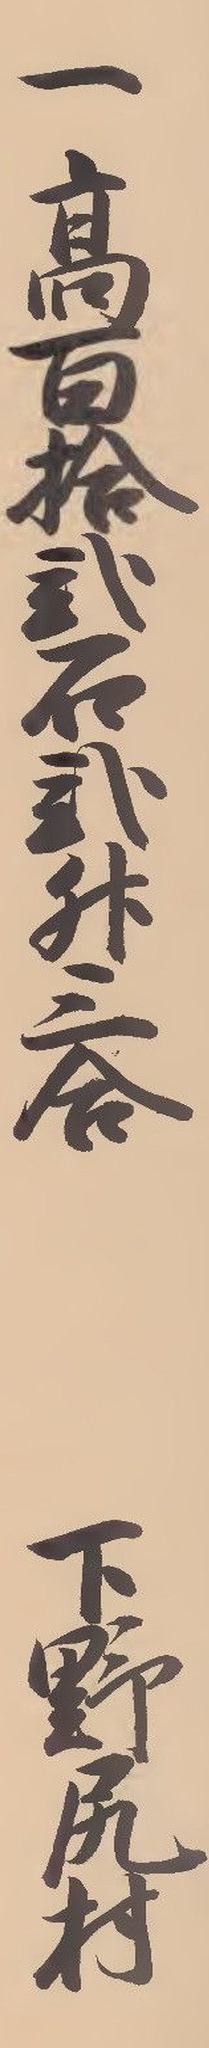一髙百拾弐石弐升三合下野尻村
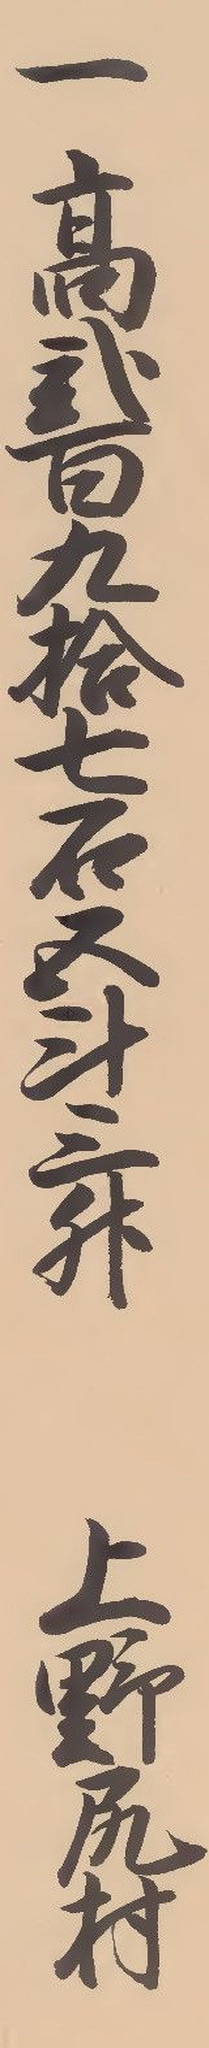一髙弐百九拾七石五斗三升上野尻村
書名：土佐国郷帳
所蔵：国立公文書館 National Archives of Japan
